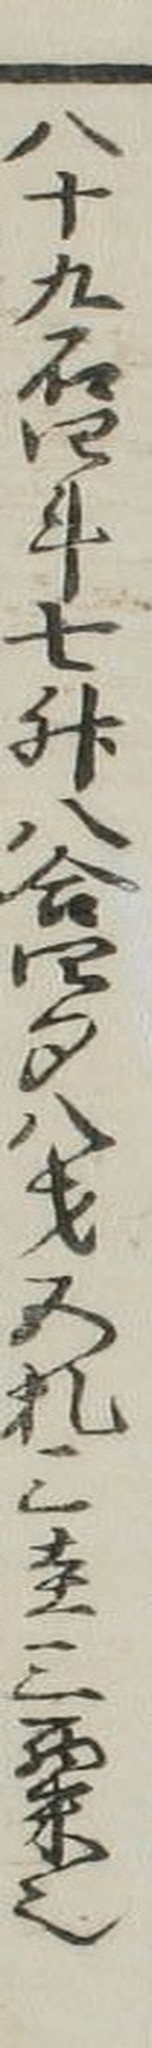八十九石四斗七升八合四勺八才五札三圭三粟也
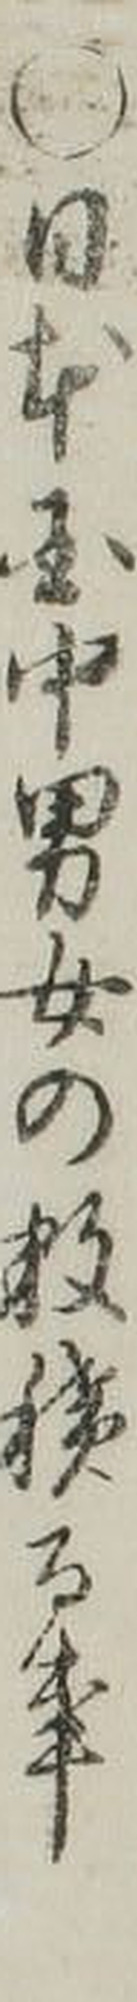○日本国中男女の数積る事
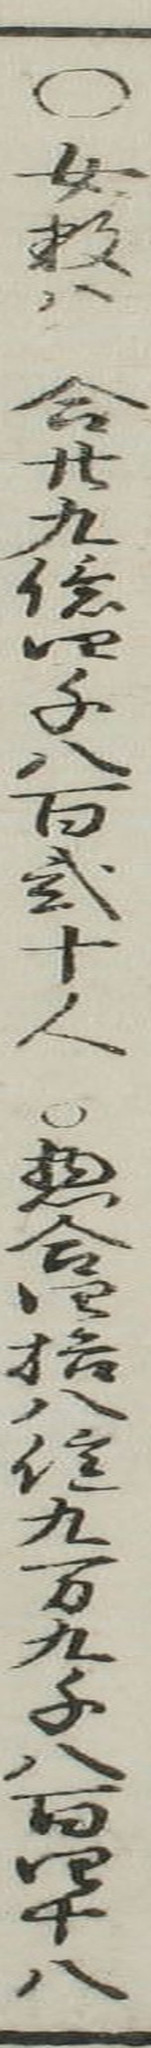○女数は合廿九億四千八百弐十人○惣合四拾八億九万九千八百四十八
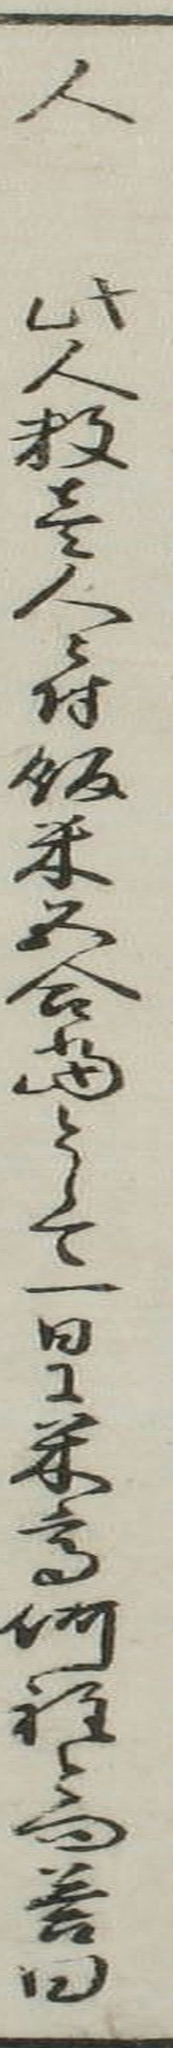人此人数壱人に付飯米五合当として一日に米高何程と問答曰
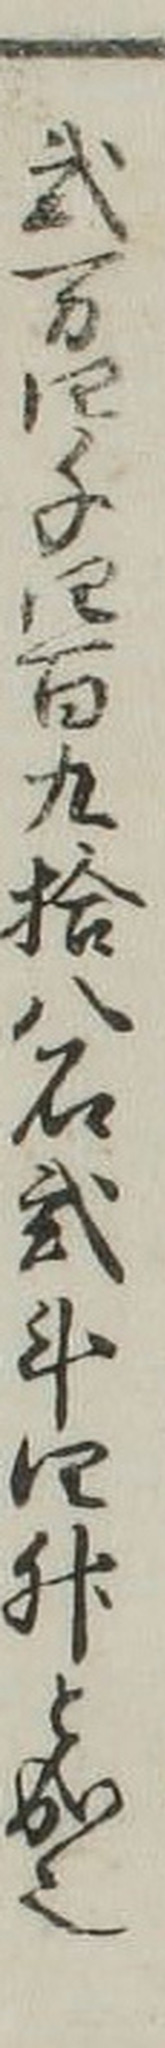弐万四千四百九拾八石弐斗四升と成也
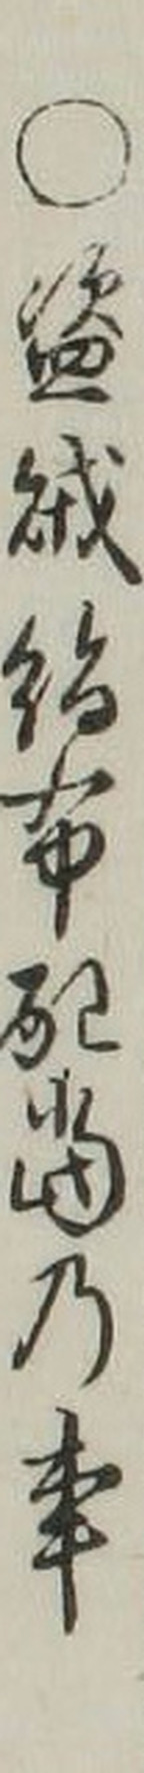○盗賊絹布配当の事
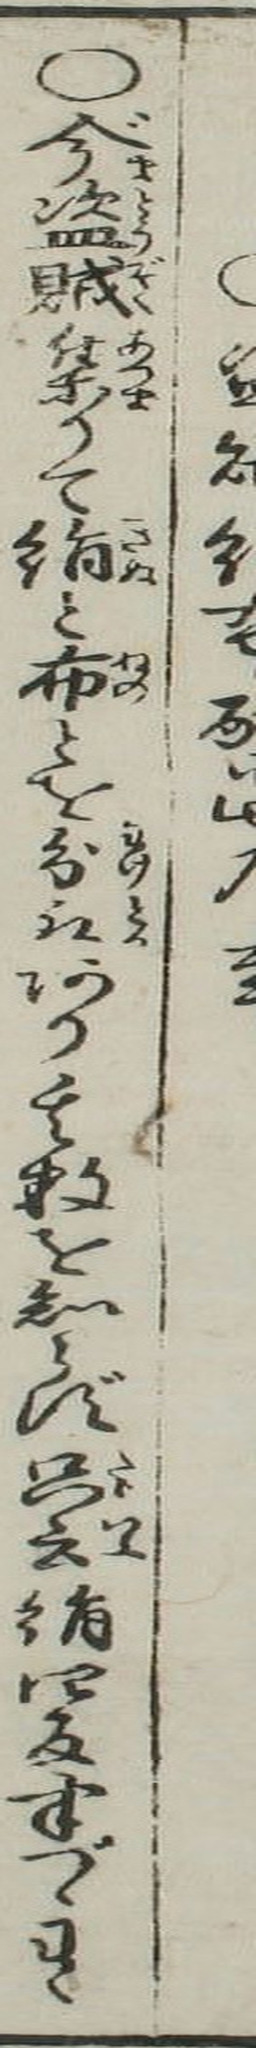○今盗賊集りて絹と布とを分取あり其数を知らず只云絹四反半づゝわく
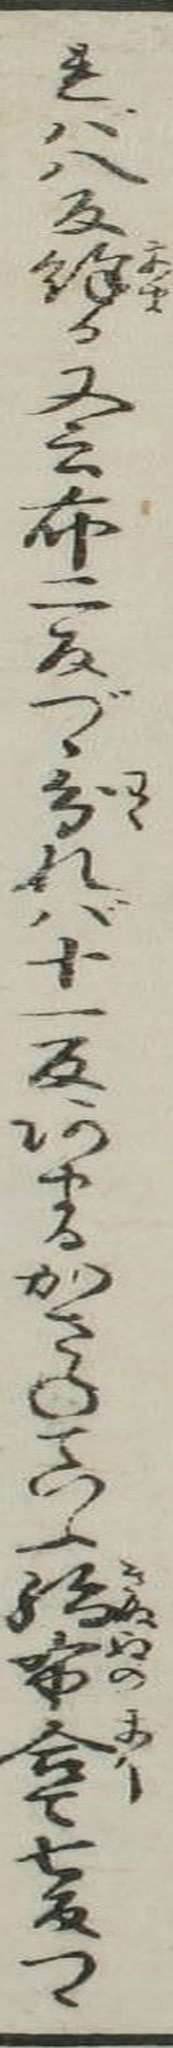れば八反余る又云布二反づゝ分れば十一反あまるかさねていふ絹布合て七反つゝ
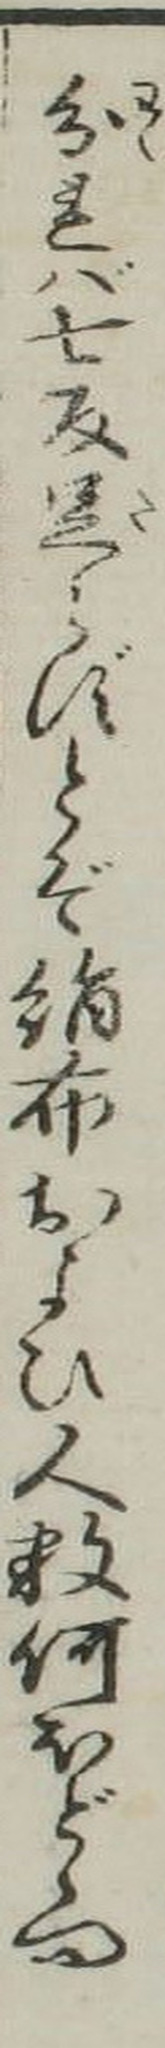分れば七反足らずとぞ絹布およひ人数何ほどゝ問

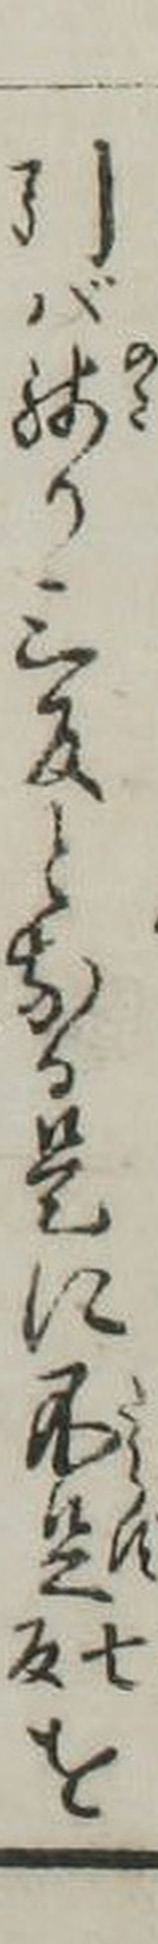引ば残り三反となる是に不足七反を
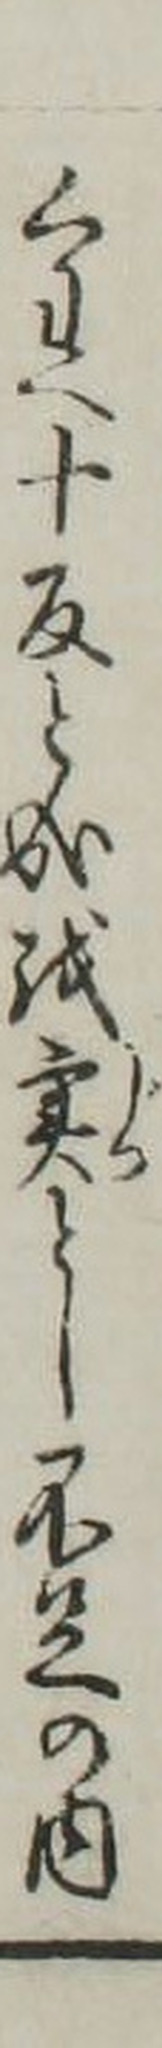くわへ十反と成を実として不足の内
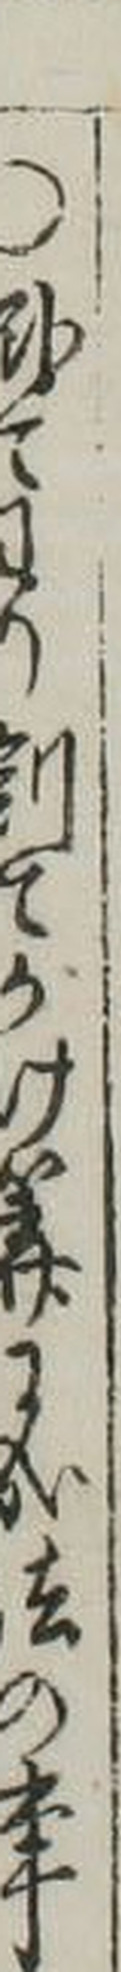○掛てわり割てかけ算に成法の事
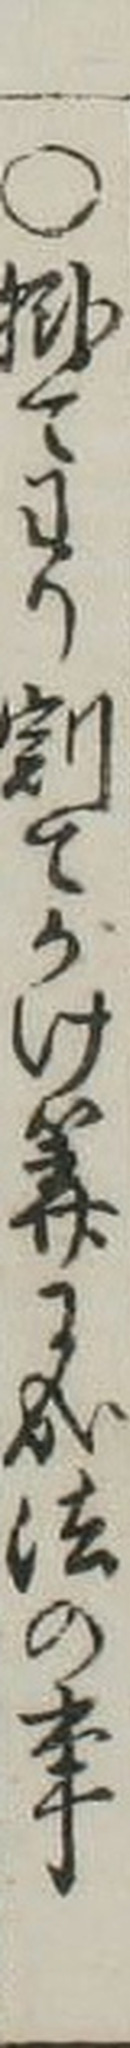○掛てわり割てかけ算に成法の事
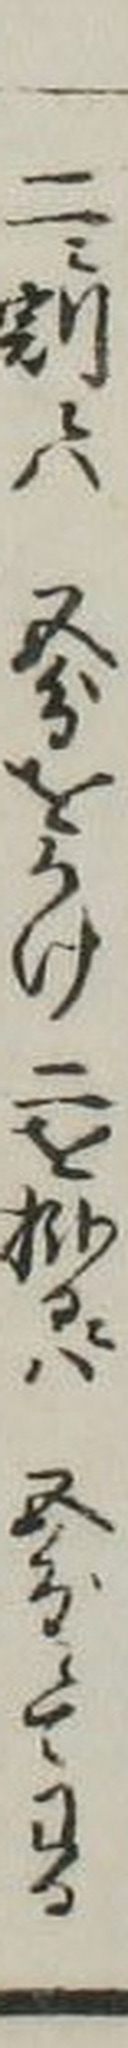二に割には五分をかけ二を掛るには五分にてわる
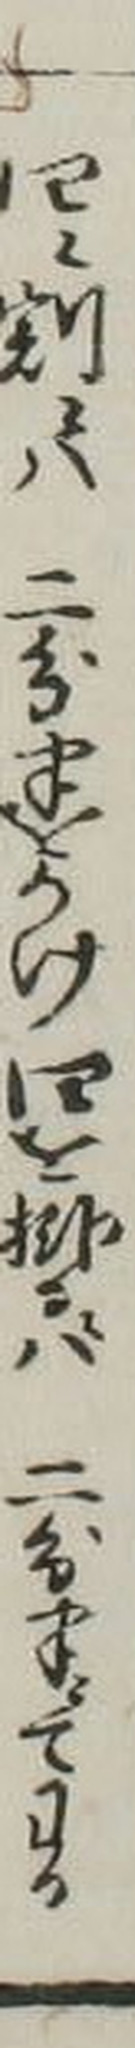四に割には二分半をかけ四を掛るには二分半にてわる
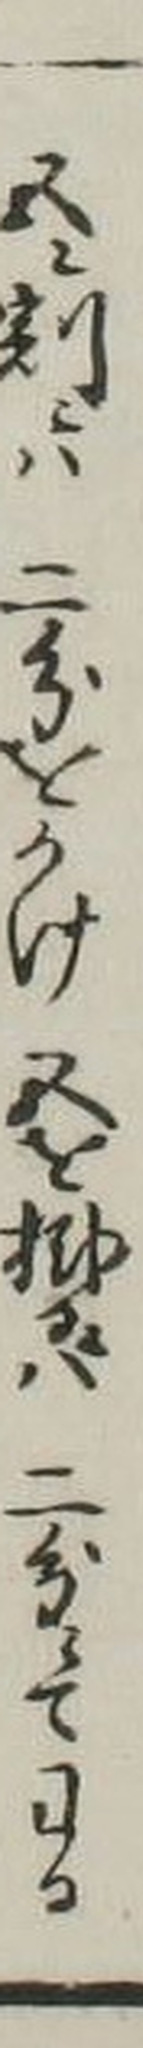五に割には二分をかけ五を掛るには二分にてわる
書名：宝玉塵劫記
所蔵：東京学芸大学教育コンテンツアーカイブ
